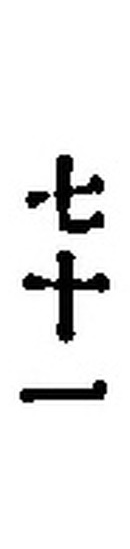七十一

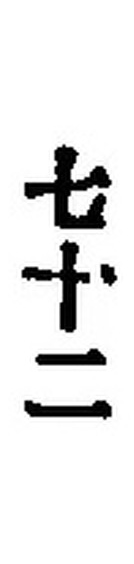七十二
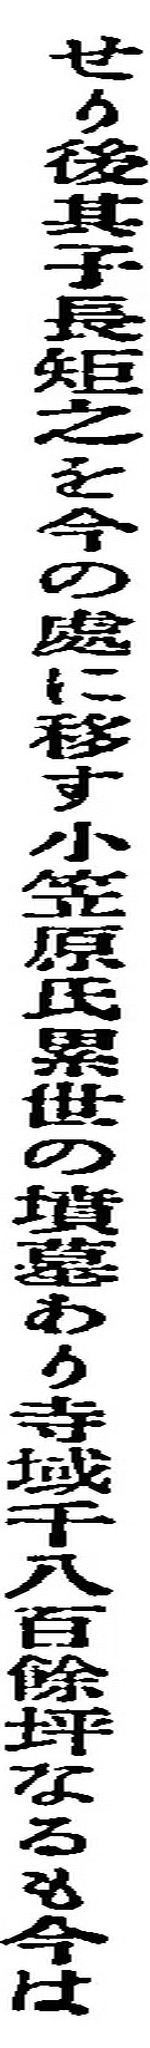せり後其子長矩之を今の處に移す小笠原氏累世の墳墓あり寺域千八百餘坪なるも今は
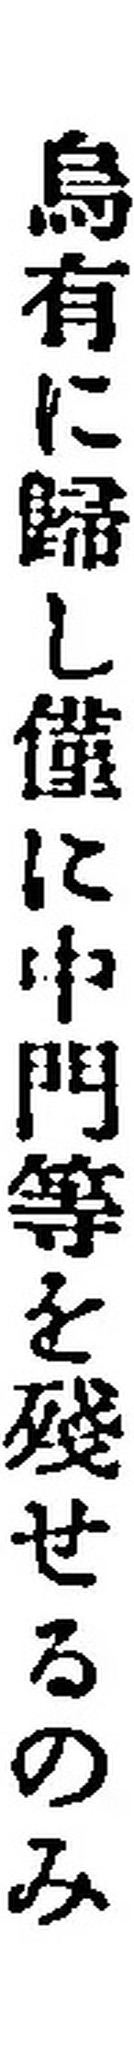烏有に歸し僅に中門等を殘せるのみ
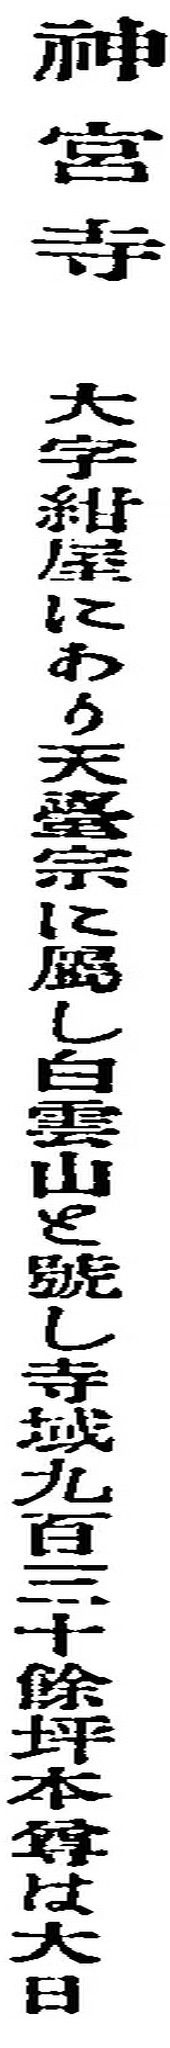大字紺屋にあり天臺宗に屬し白雲山と號し寺域九百三十餘坪本尊は大日
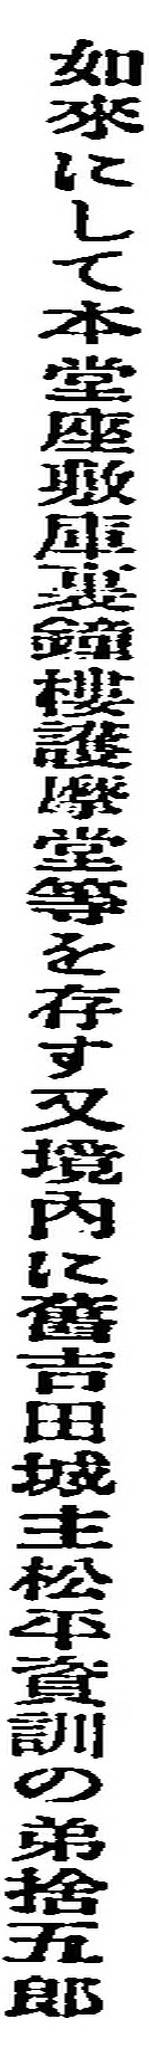如來にして本堂座敷庫裏鐘樓護摩堂等を存す又境内に舊吉田城主松平資訓の弟捨五郞
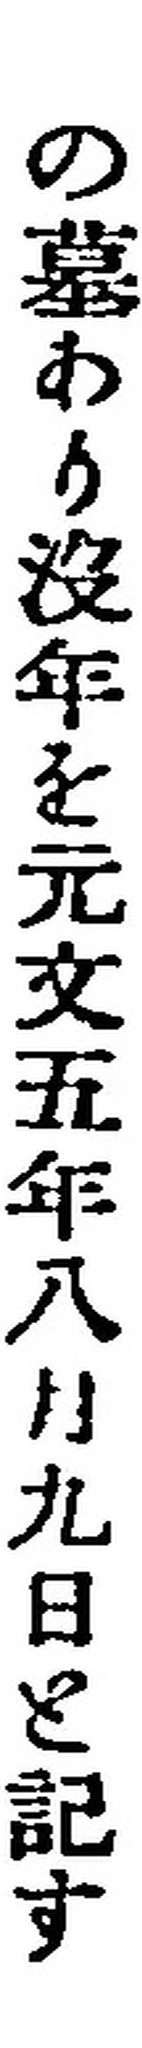の墓あり没年を元文五年八月九日と記す
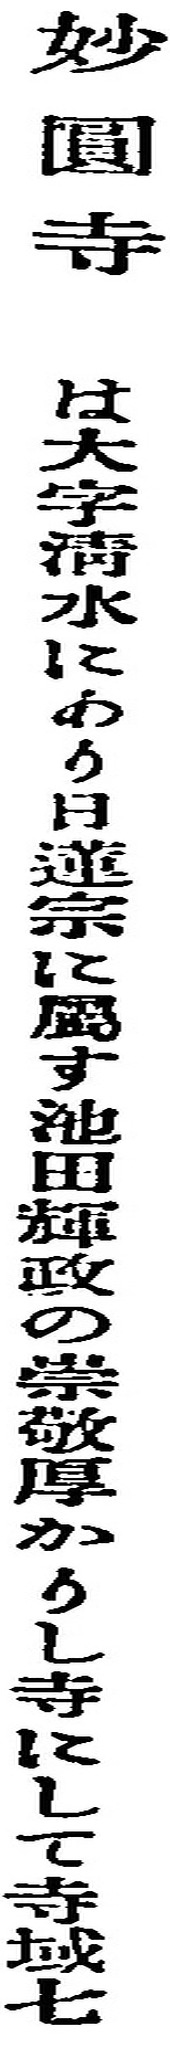は大字淸水にあり日蓮宗に屬す池田輝政の崇敬厚かりし寺にして寺域七
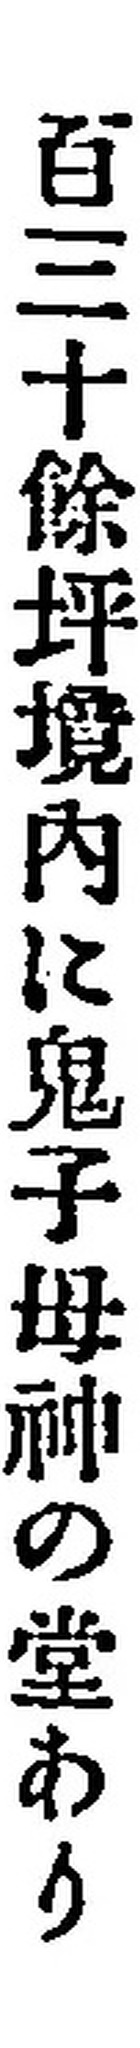百三十餘坪境内に鬼子母神の堂あり
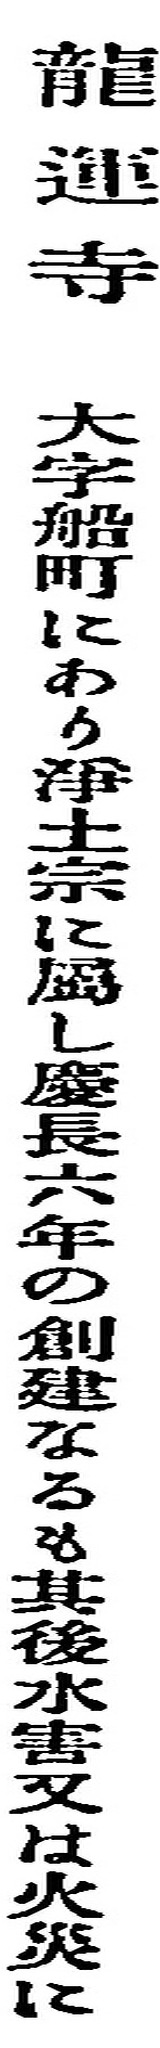龍運寺大字船町にあり淨土宗に屬し慶長六年の創建なるも其後水害又は火災に
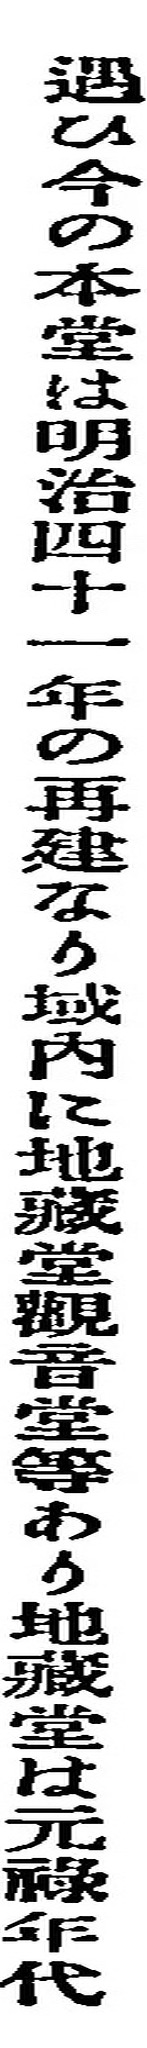遇ひ今の本堂は明治四十一年の再建なり域内に地藏堂觀音堂等あり地藏堂は元祿時代
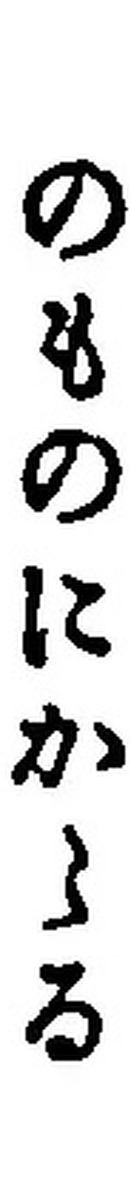のものにかゝる
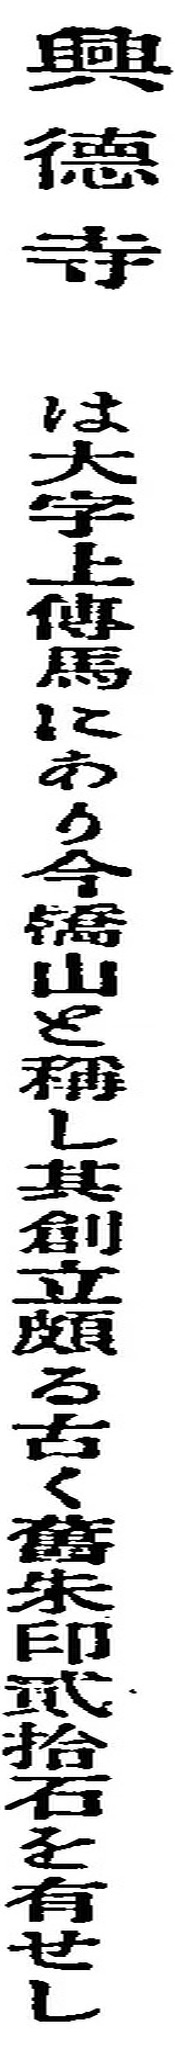興德寺は大字上傳馬にあり今橋山と稱し其創立頗る古く舊朱印貳拾石を有せし
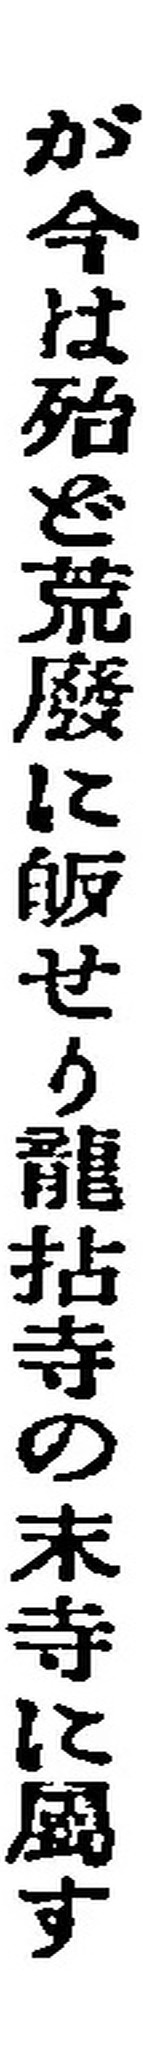が今は殆ど荒廢に皈せり龍拈寺の末寺に屬す
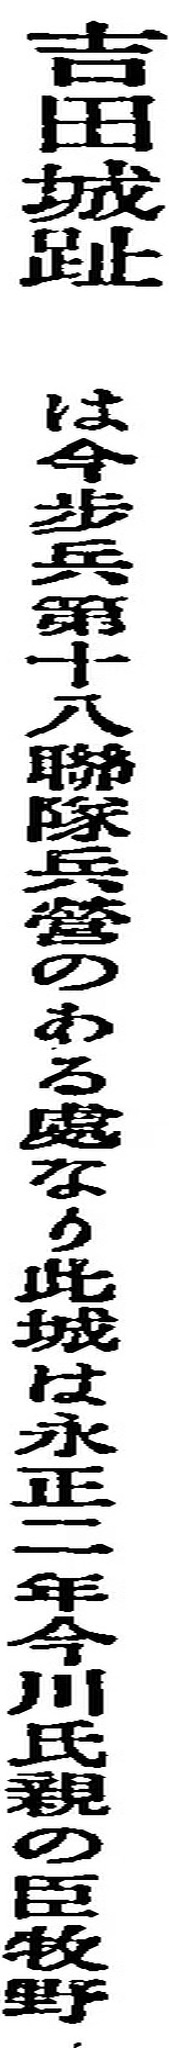吉田城趾は今歩兵第十八聯隊兵營のある處なり此城は永正二年今川氏親の臣牧野
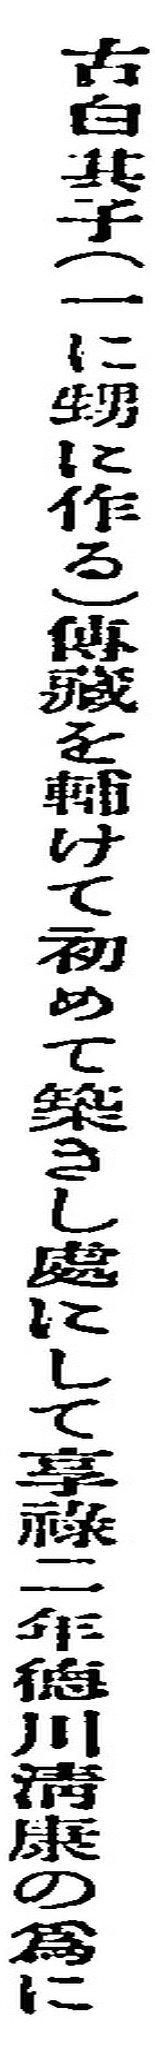古白其子(一に甥に作る)傳藏を輔けて初めて築きし處にして享祿二年德川淸康の爲に
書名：豊橋志要
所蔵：国立国会図書館 National Diet Library, JAPAN
